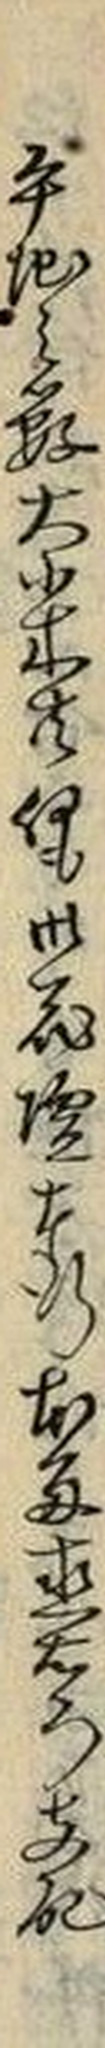平地之薮大小木共何も御花壇奉行本多直右衛門支配
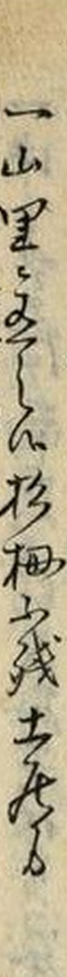一山里ニ有之候杉栂不残土居方
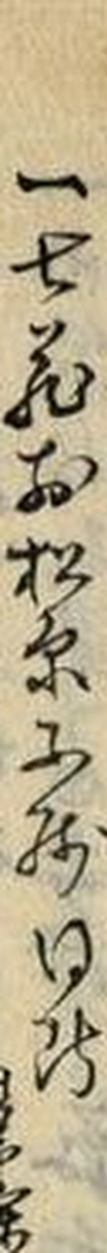一七蔵前松原不残同断
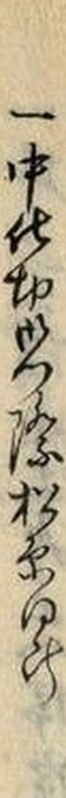一中仕切御門際松原同断
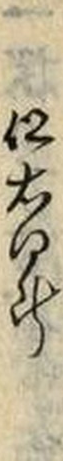但右同断
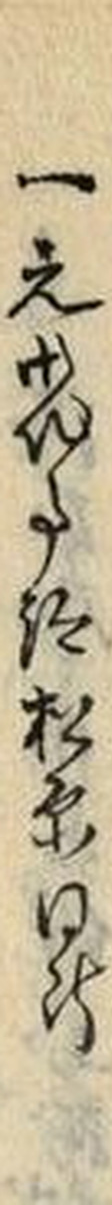一元御作事跡松原同断
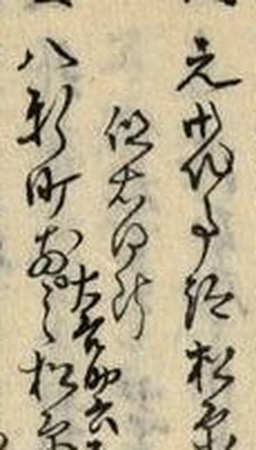但右同断
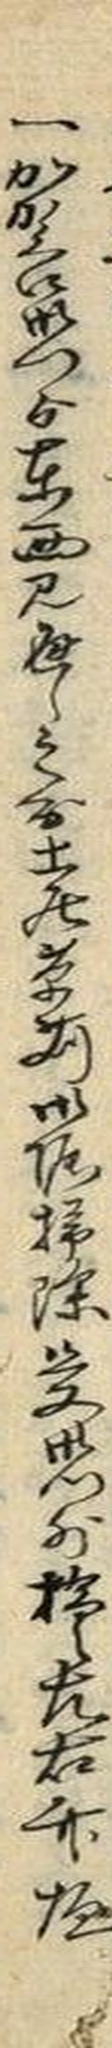一加賀口御門ゟ東西見通し之分土居草苅御堀掃除且又御門外橋之左右竹垣
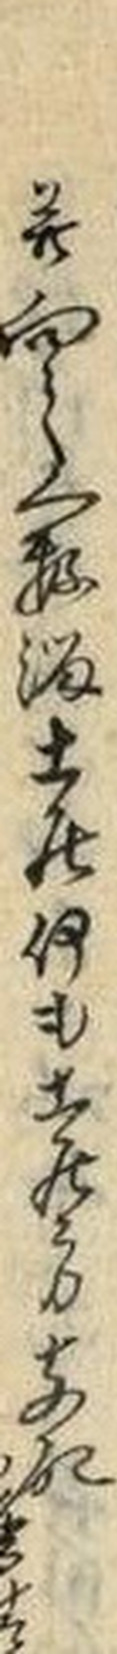并向之人数溜土居何も土居方支配

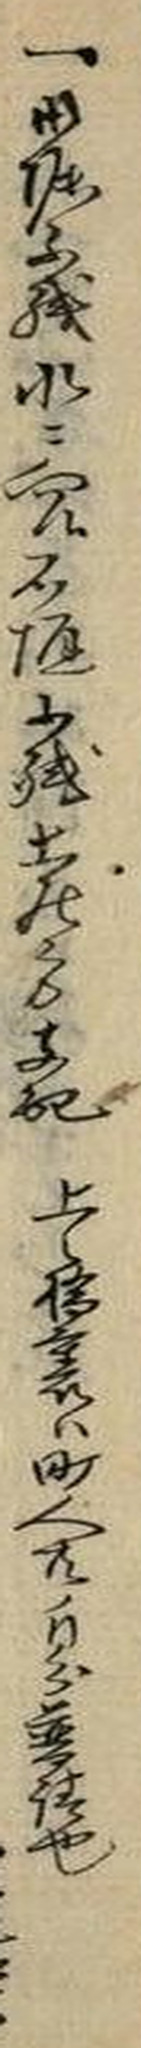一御堀不残水に向候石垣不残土居方支配上之橋裏は町人共自分普請也
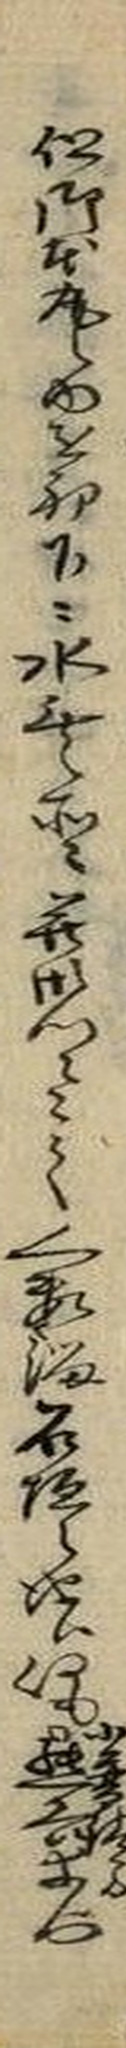但御本丸之内を初下に水無之所々并御門々々之人数溜石垣之儀は何も小普請方熊谷幸右衛門
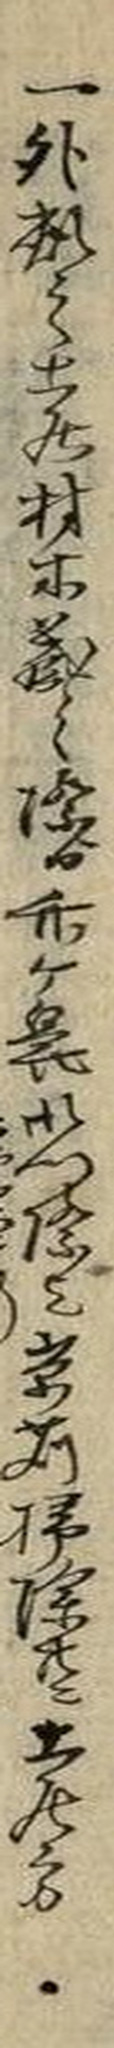一外頬之土居材木蔵之際ゟ竹ケ鼻御門際迄草苅掃除共に土居方
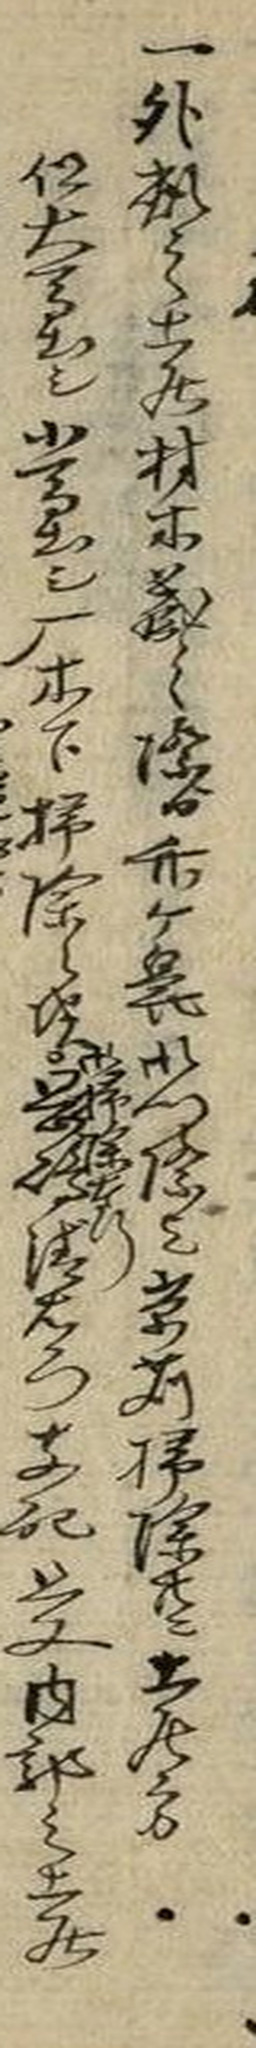但大馬出シ小馬出シ厂木下掃除之儀は掃除奉行岡島清右衛門支配且又内郭之土居
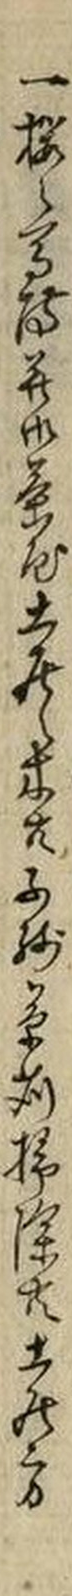一桜之馬場并御茶屋土居之木共不残草苅掃除共土居方
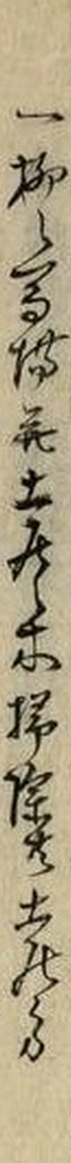一柳之馬場并土居之木掃除共土居方
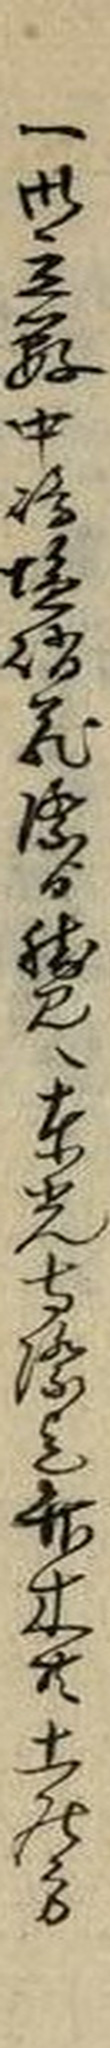一御立薮中島塩硝蔵際ゟ勝見へ東光寺際迄竹木共土居方
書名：御城下諸事之部
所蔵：福井県文書館 Fukui Prefectural Archives
